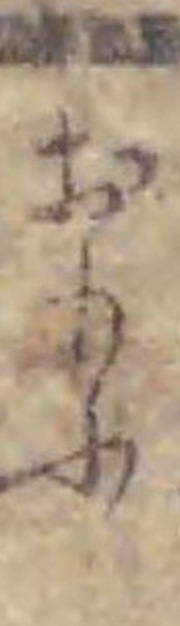おもふ
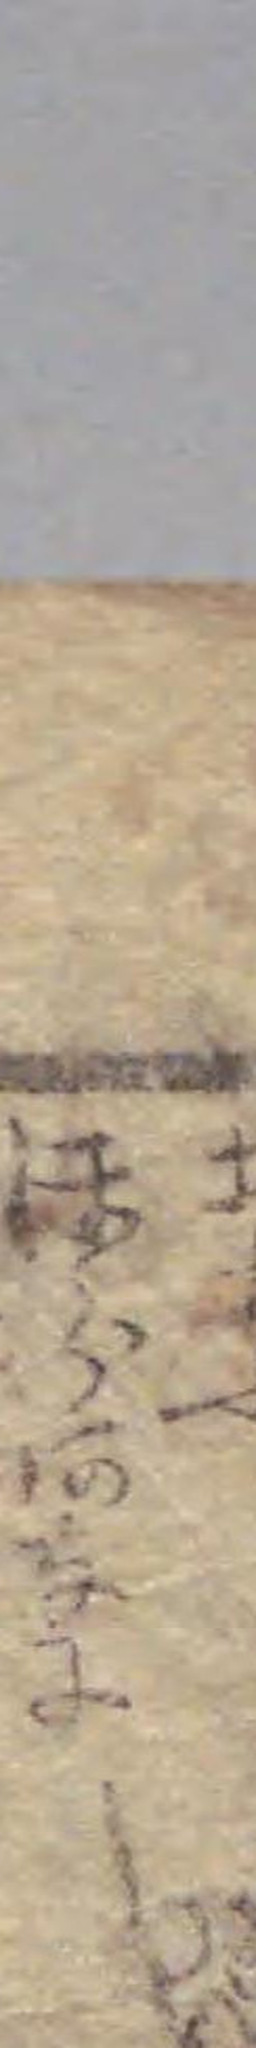ほらあなに
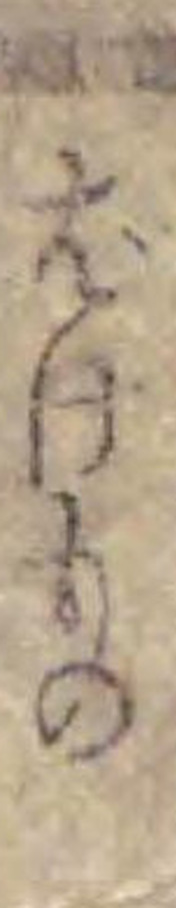ばけもの
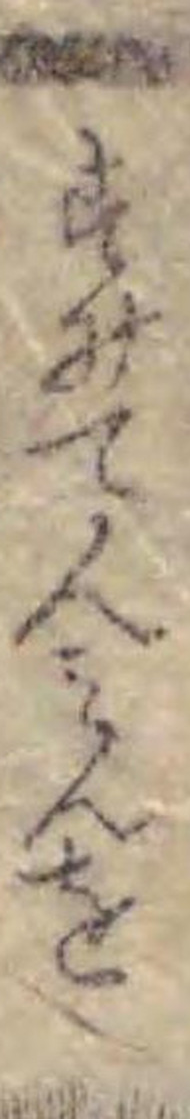すみて人みんを
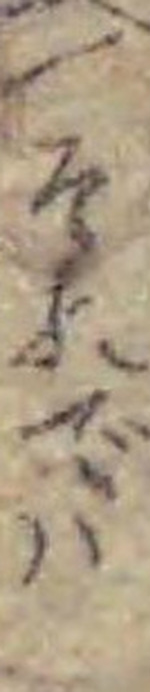それでは
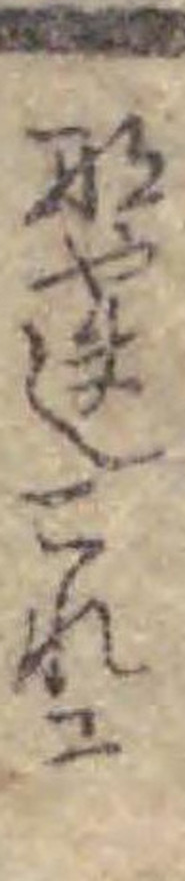なやましこれに
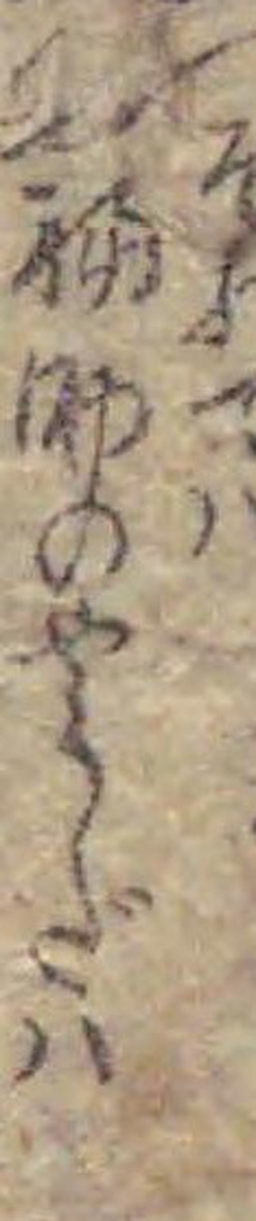福助のやうだは
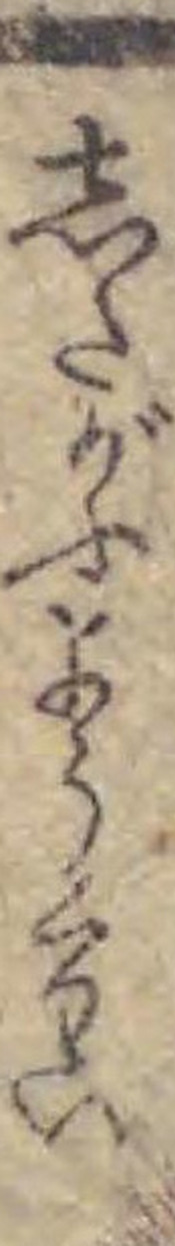したがふようくわい
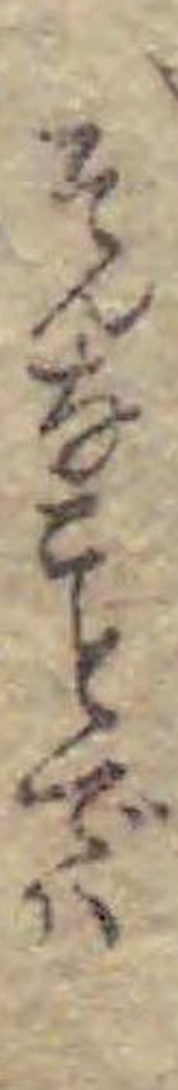そんなことでは
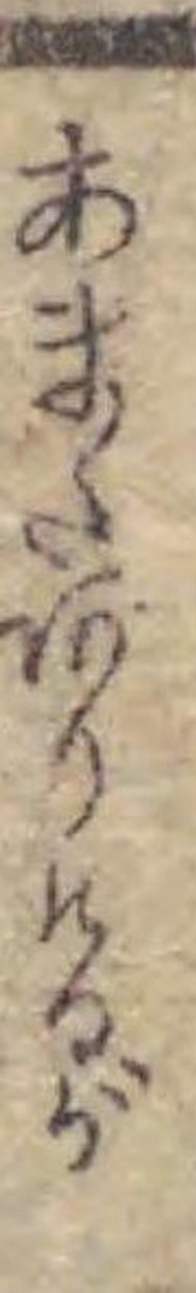あまたありけるが
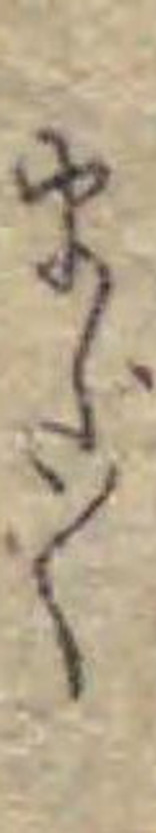まだ〴〵
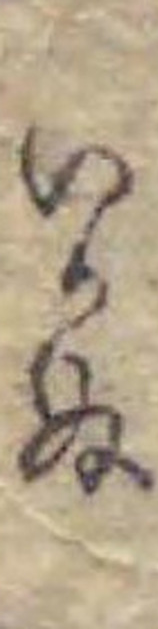いかぬ
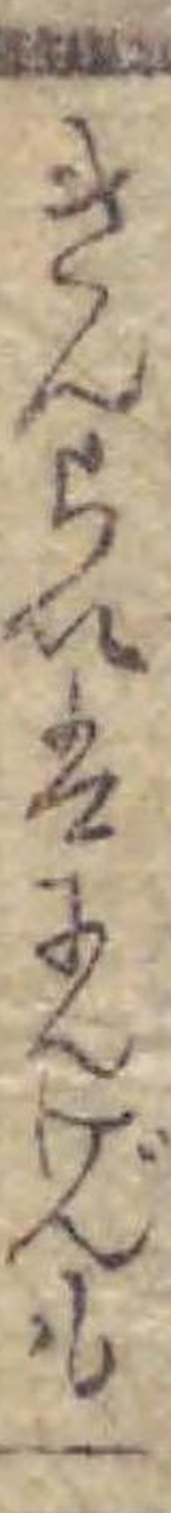きんらいはにんげんも
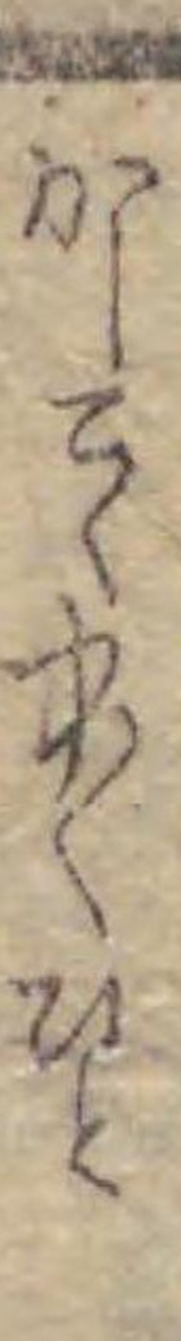かしこく中〳〵ひと
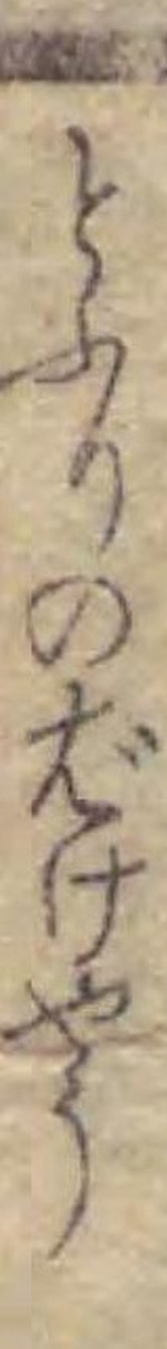とふりのばけやう
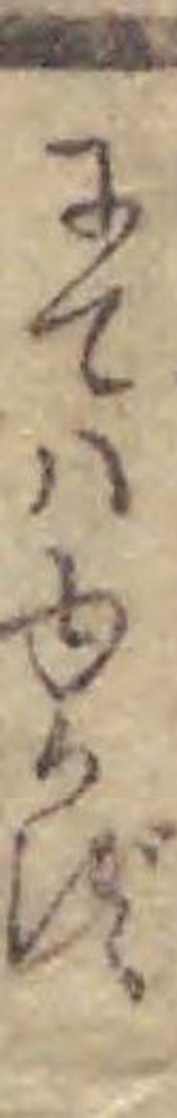にてはゆかず
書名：化物世界夜半嵐 : 3巻
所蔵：国立国会図書館 National Diet Library, JAPAN
